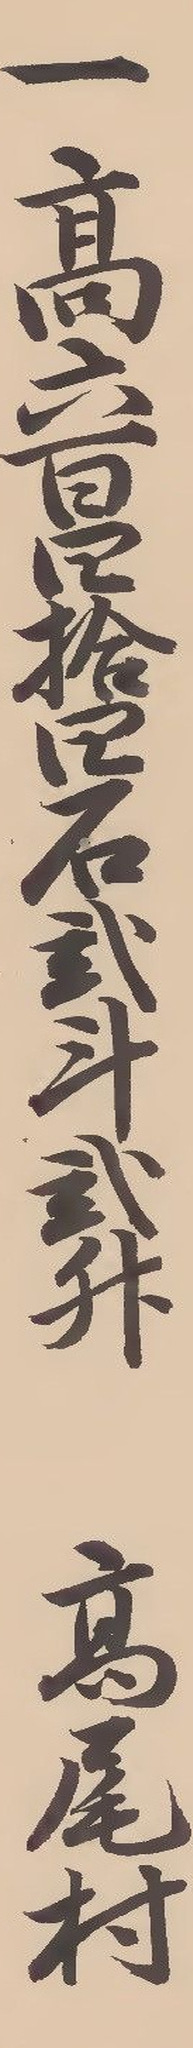一高六百四拾四石弐斗弐升高尾村

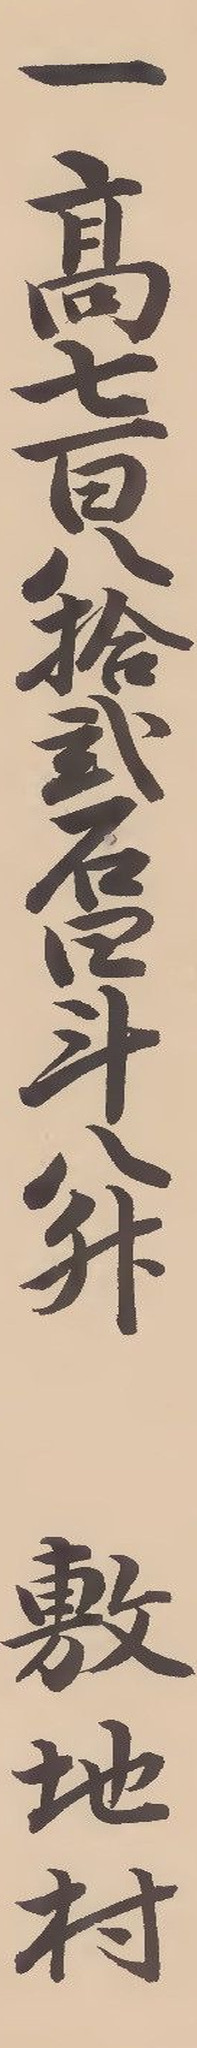一高七百八拾弐石四斗八升敷地村
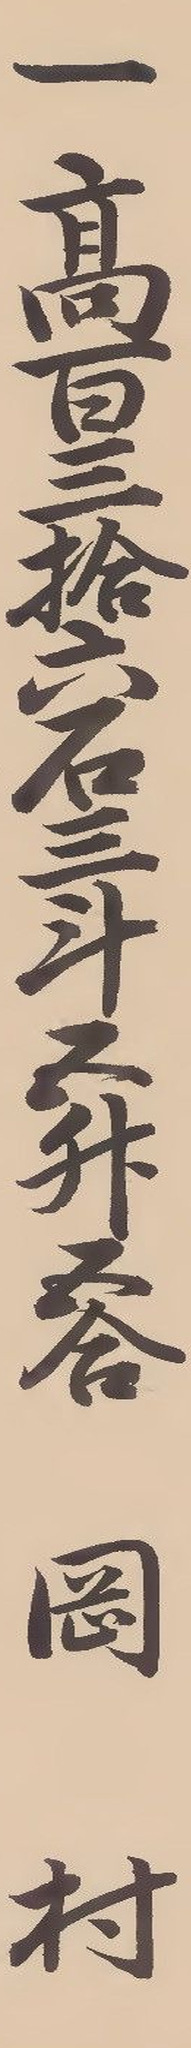一高百三拾六石三斗五升五合岡村
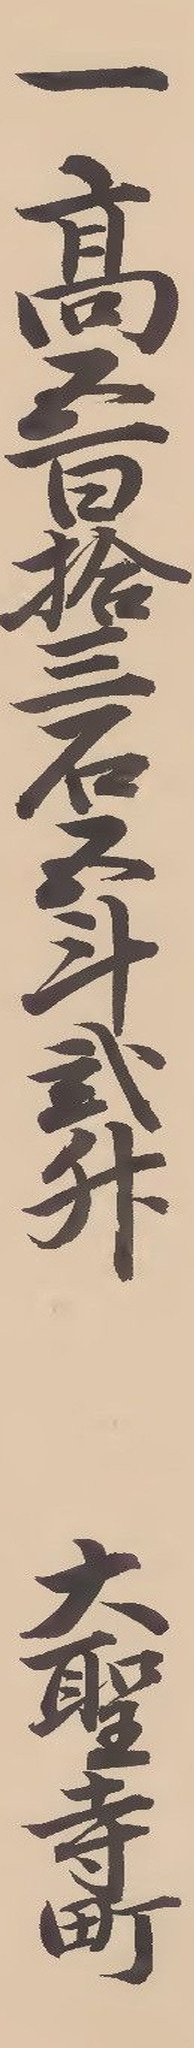一高五百拾三石五斗弐升大聖寺町
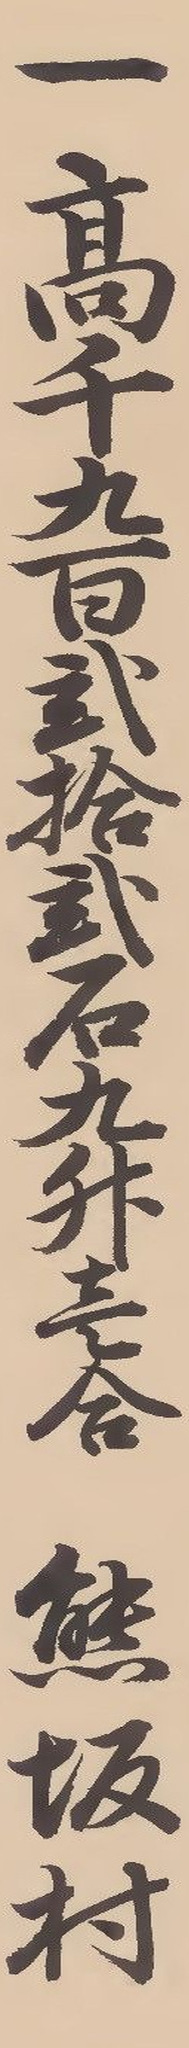一高千九百弐拾弐石九升壱合熊坂村
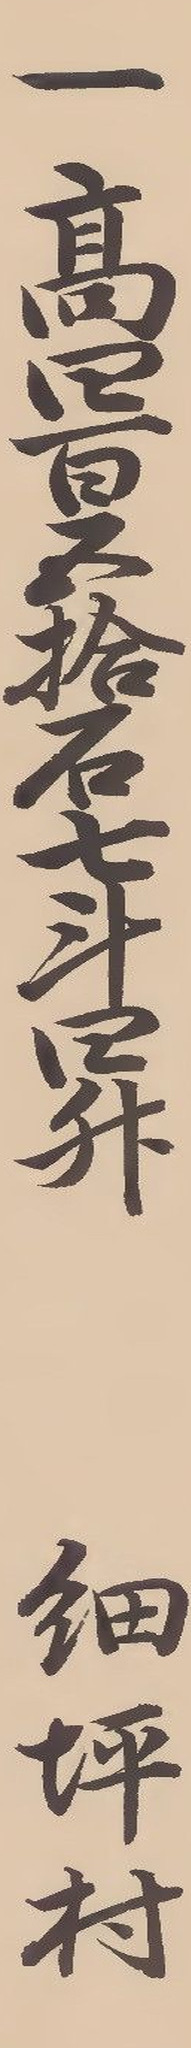一高四百五拾石七斗四升細坪村
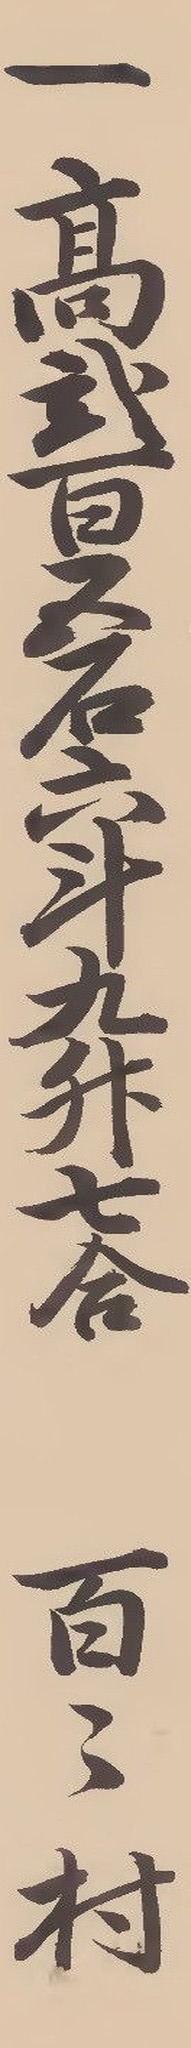一高弐百五石六斗九升七合百々村
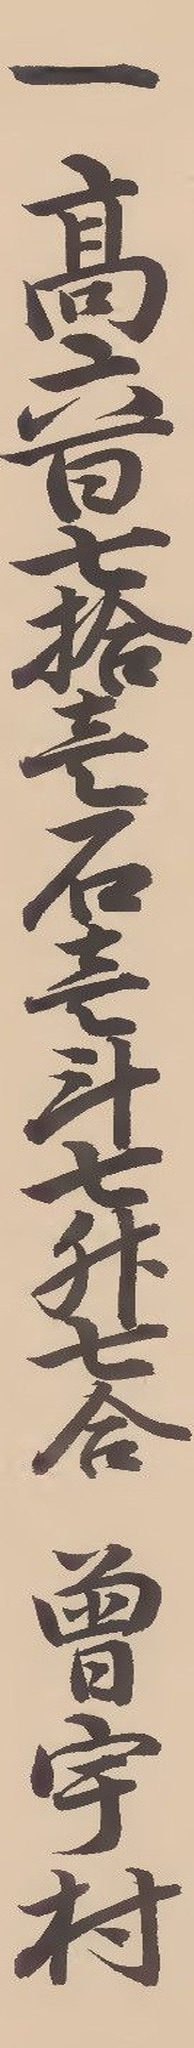一高六百七拾壱石壱斗七升七合曽宇村
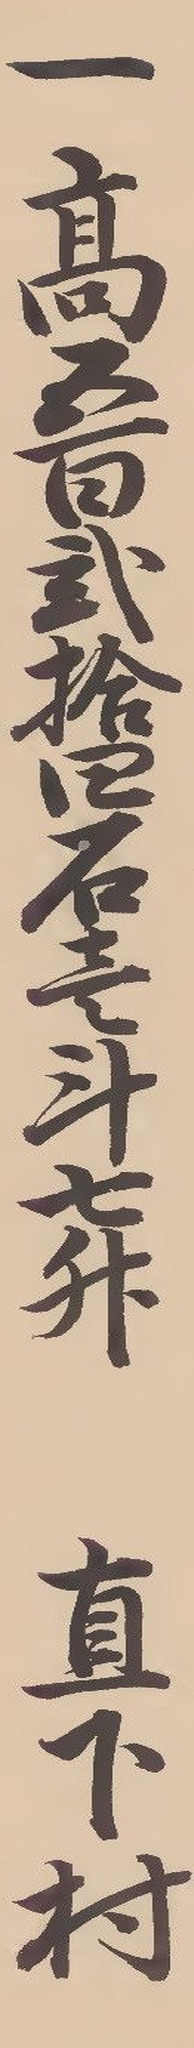一高五百弐拾四石壱斗七升直下村

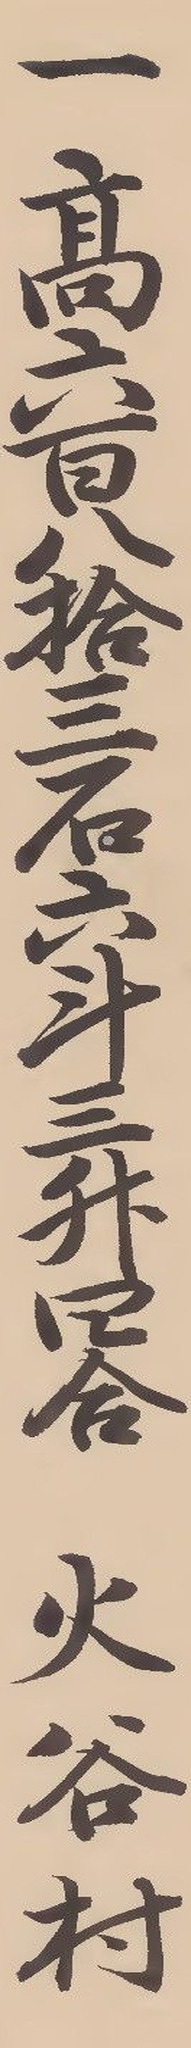一高六百八拾三石六斗三升四合火谷村
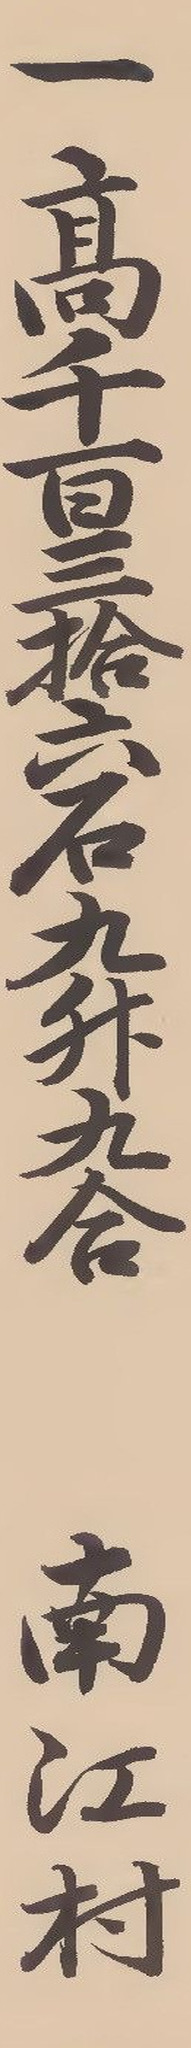一高千百三拾六石九升九合南江村
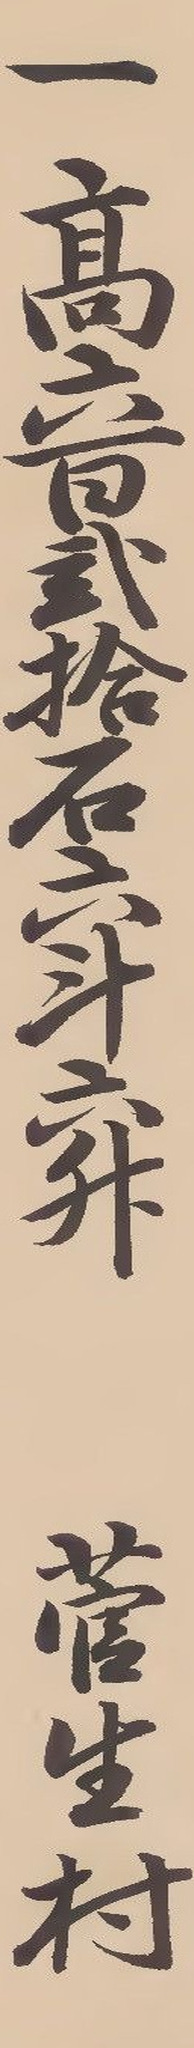一高六百弐拾石六斗六升菅生村
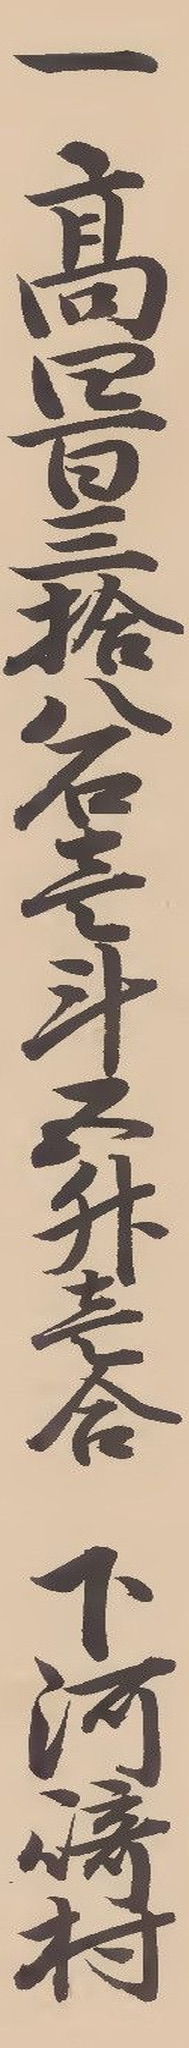一高四百三拾八石壱斗五升壱合下河崎村
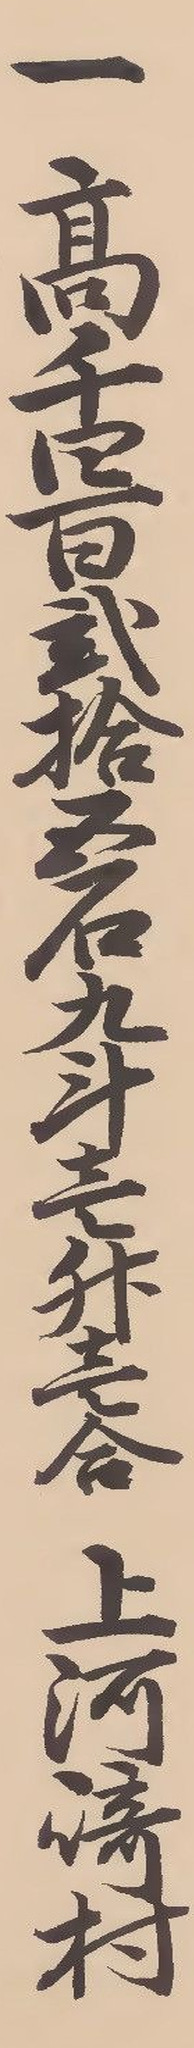一高千四百弐拾五石九斗壱升壱合上河崎村
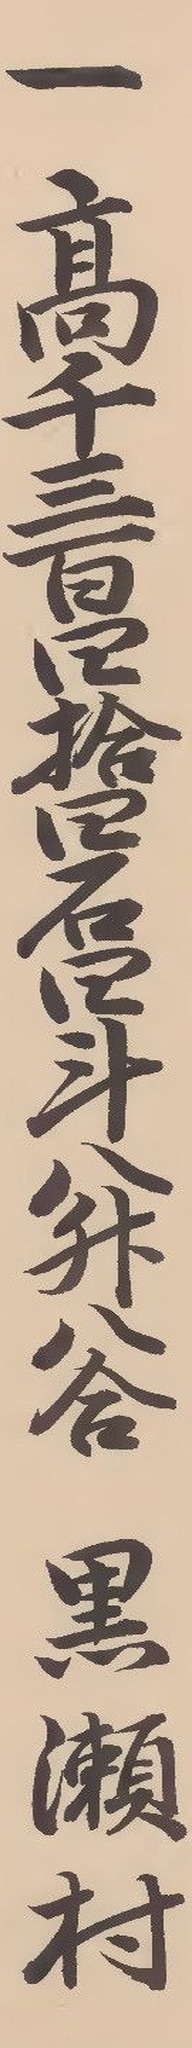一高千三百四拾四石四斗八升八合黒瀬村
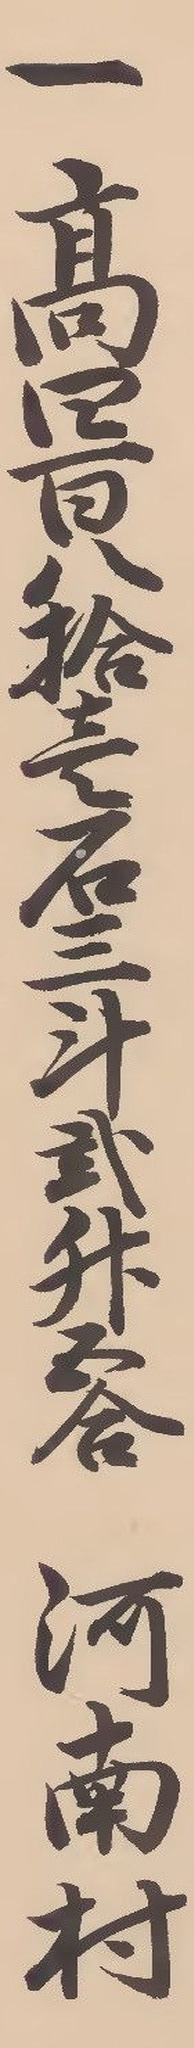一高四百八拾壱石三斗弐升五合河南村
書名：加賀国郷帳
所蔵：国立公文書館 National Archives of Japan
